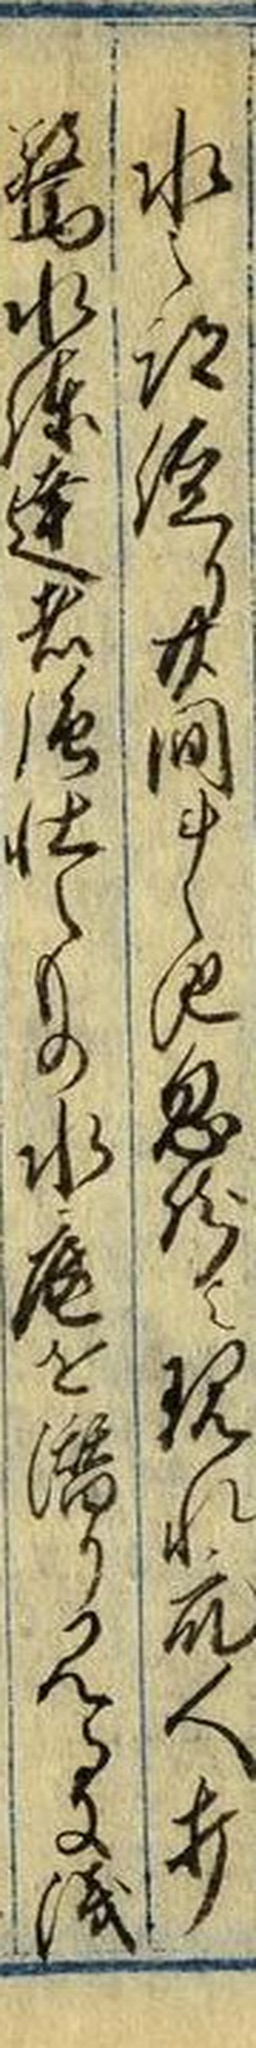驚水練達者強壮之のもの水底を潜り見るに浅
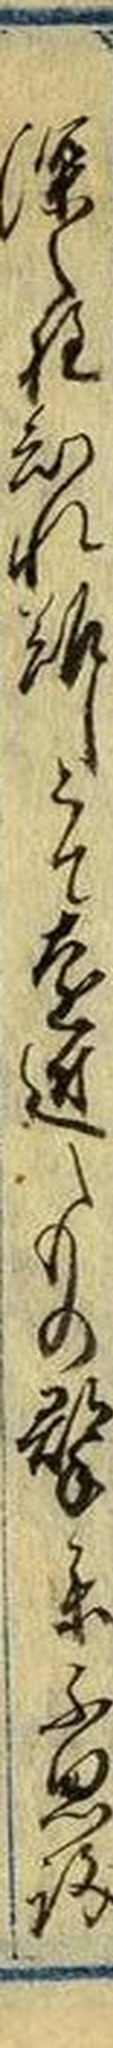深之程知れ難しとて遠近之もの群参不思議
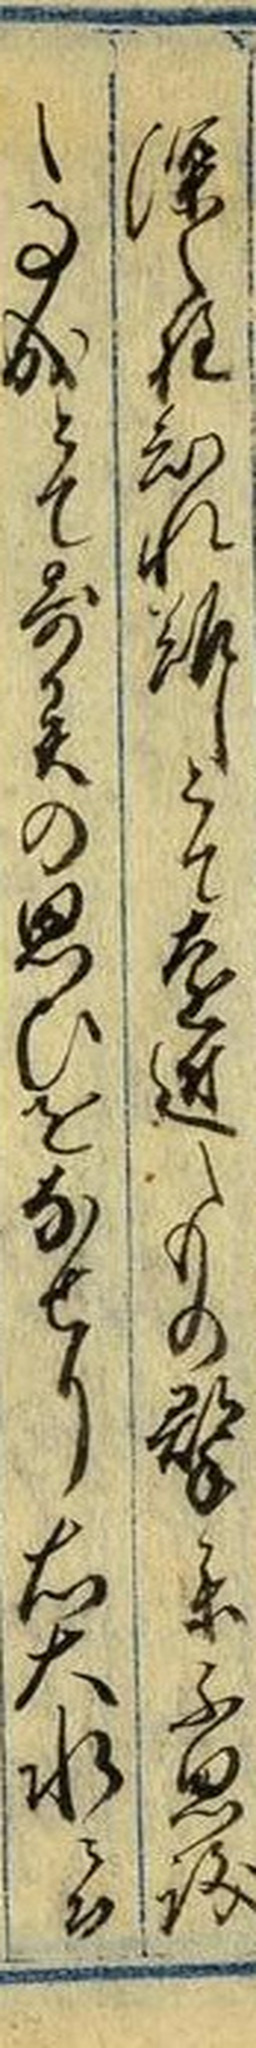之事成とて寄異の思ひをなせり右大水に而
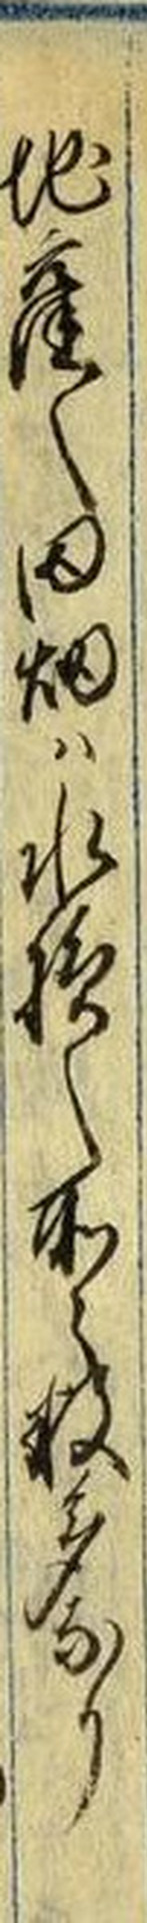地産之田畑は水損之所々数多なり
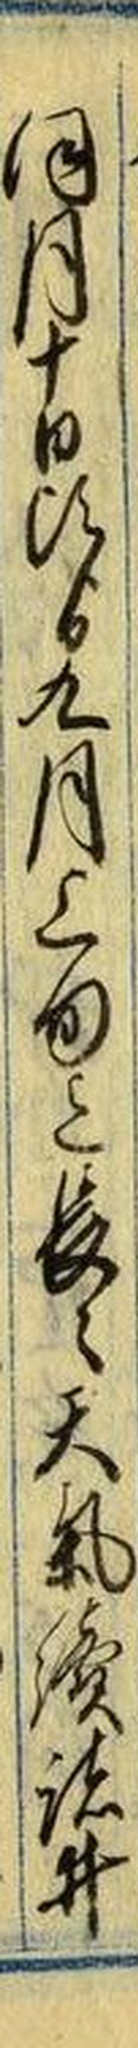同月十日頃ゟ九月上旬迄長々天気続諸井
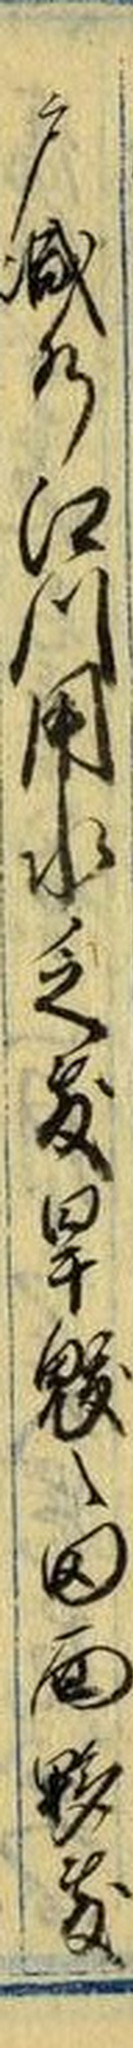戸減水郷川用水乏敷旱魃之田面夥敷
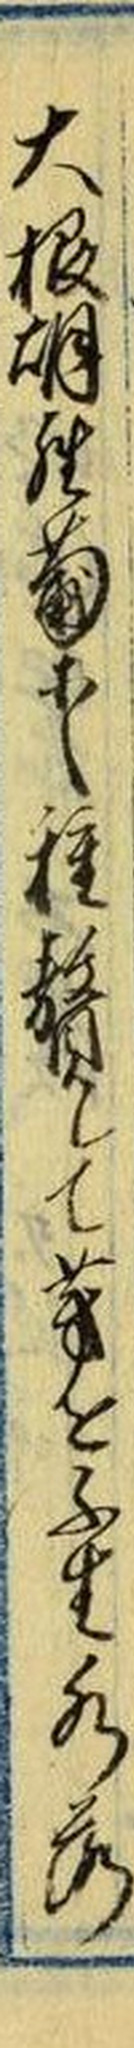大根胡羅蔔等之種贅して芽を不生水落
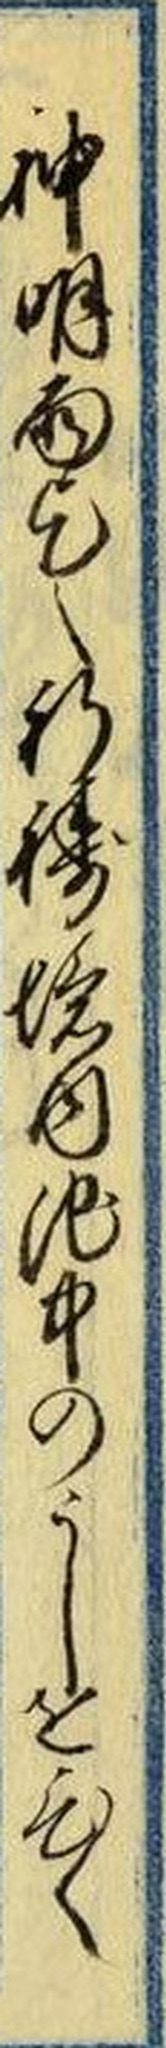神明雨乞之祈祷境内池中のうしをひく
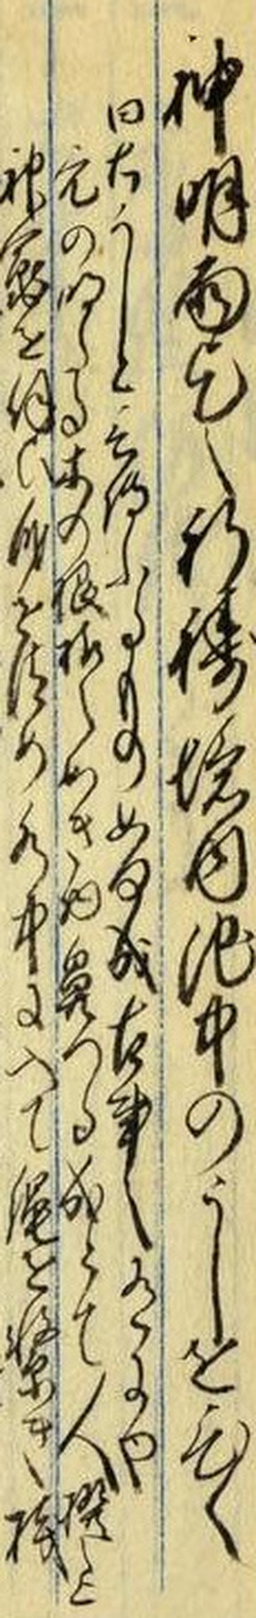曰右うしと言伝ふるもの如何成古事之有にや
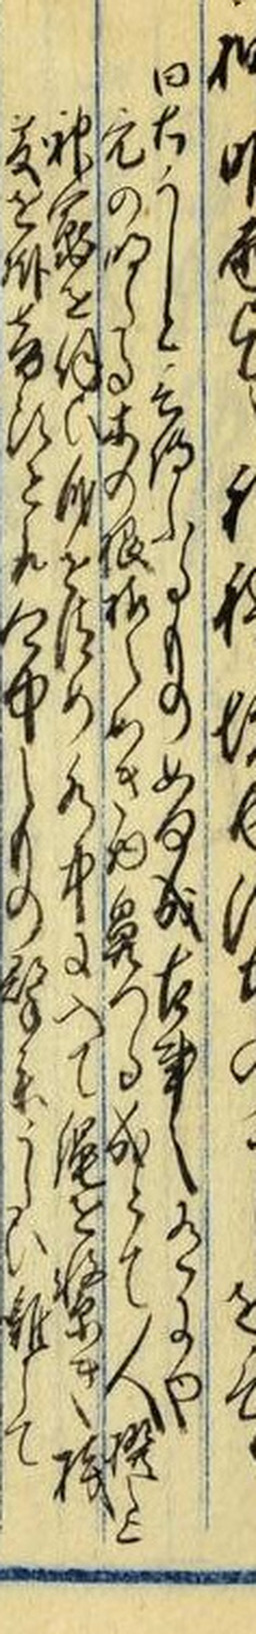元の明たる木の根様之如き物鼻つる成とて人撰之上
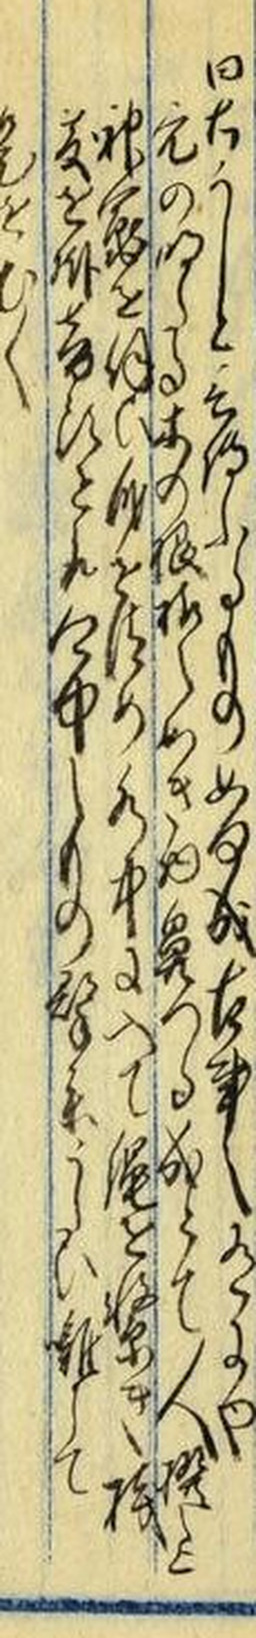神鬮を伺ひ身を清め水中に入て縄を繋き桟
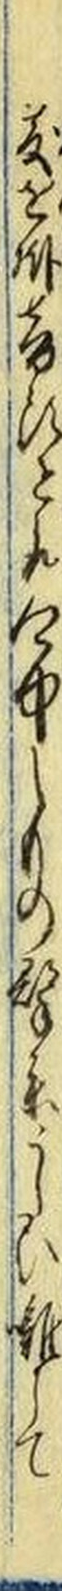敷を掛音頭を取郷中之もの群参うたひ囃して
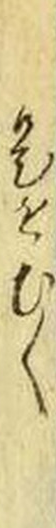是をひく
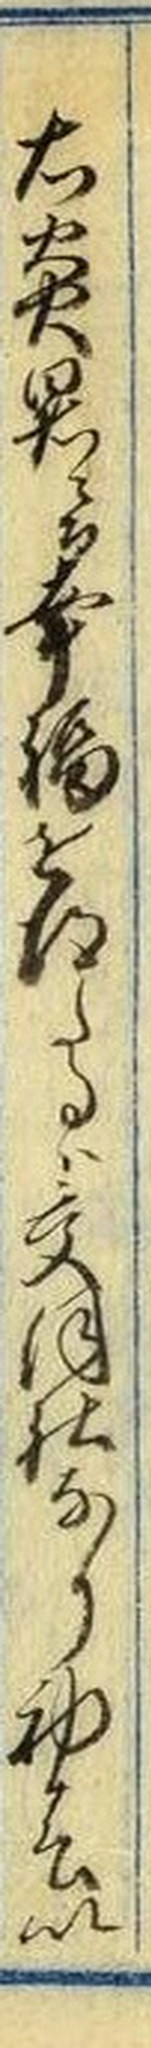右炎暑に而幸福を得たるは交同社なり初春以
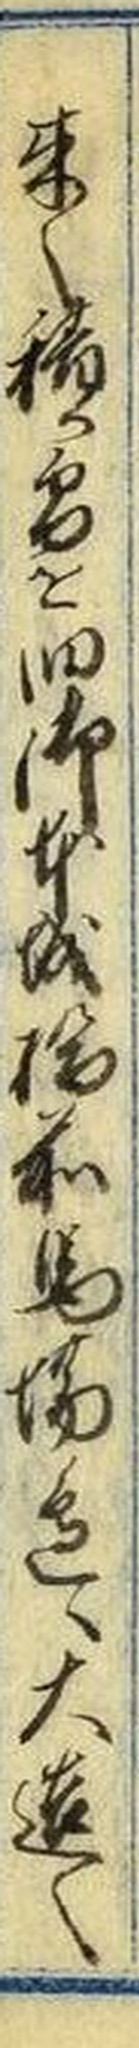来之積り雪を旧御本城橋前馬場辺へ大造之
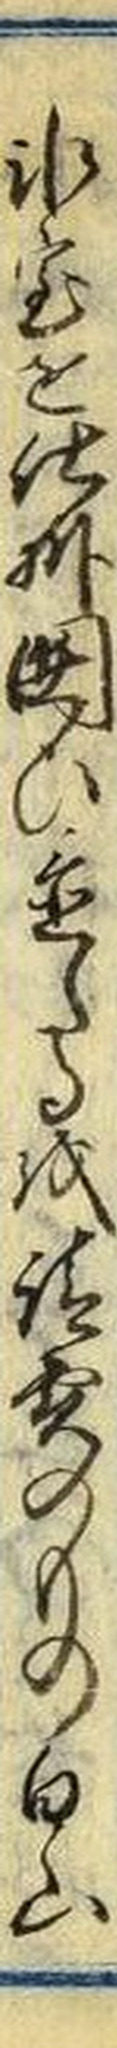氷室を仕掛囲ひ置たるを請売のもの白山
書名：温古集 五巻
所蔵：福井県文書館 Fukui Prefectural Archives
